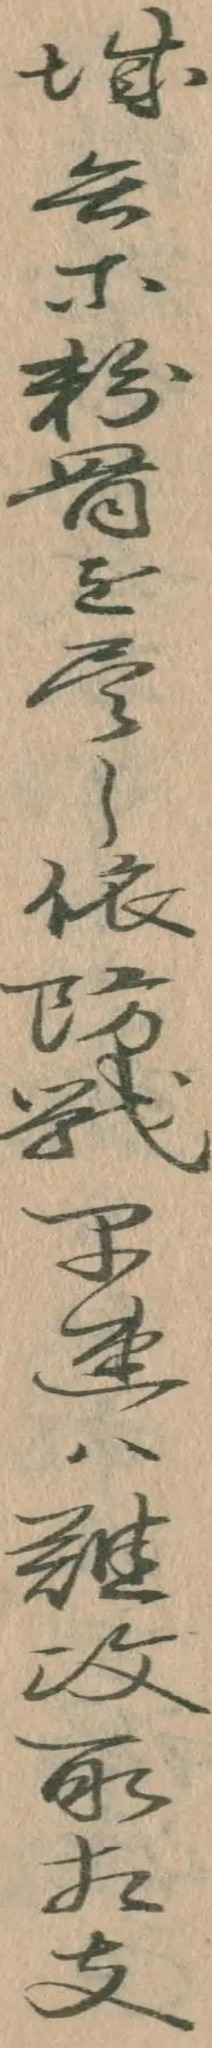城兵等粉骨を尽し依防戦早速は難攻取相支
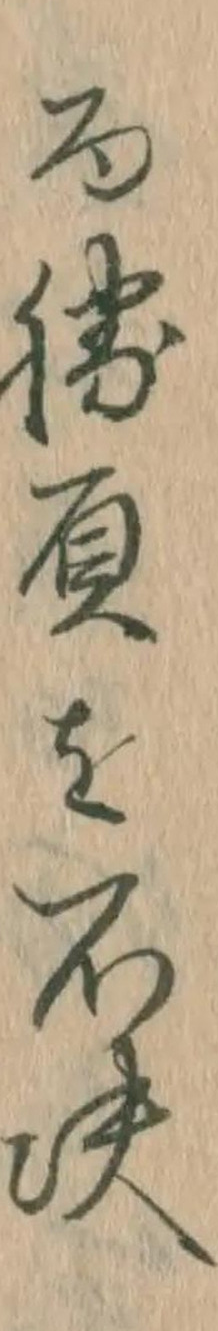而勝負を不決
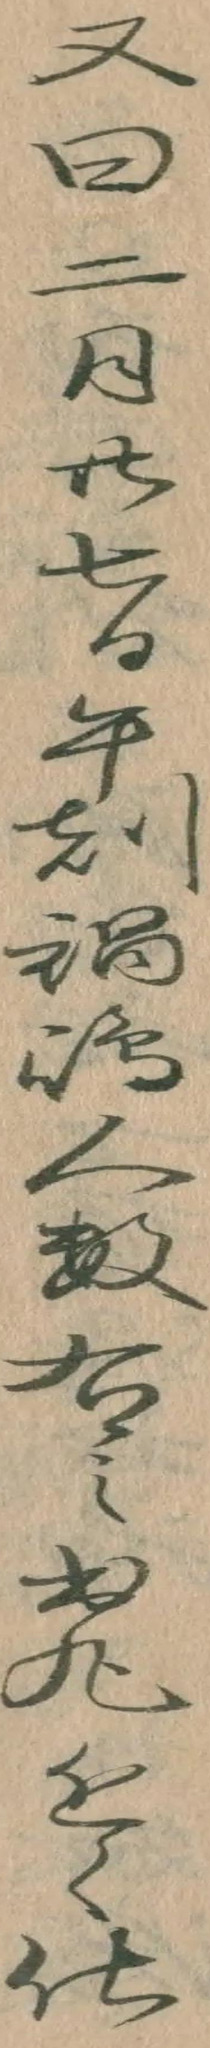又曰二月廿七日午刻鍋島人数右之出丸近く仕
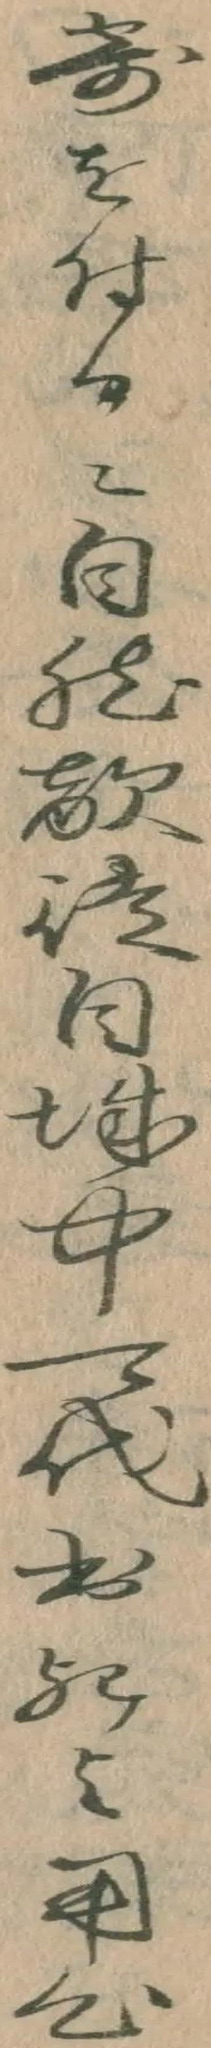寄を付るに自然敵徒自城中可伐出歟与用心
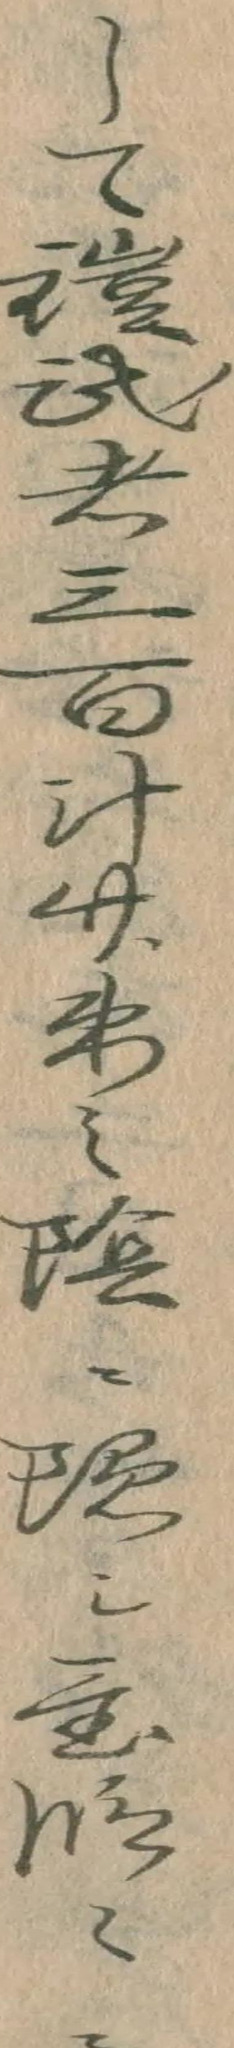して鎧武者三百斗竹束之陰に隠し置段々に
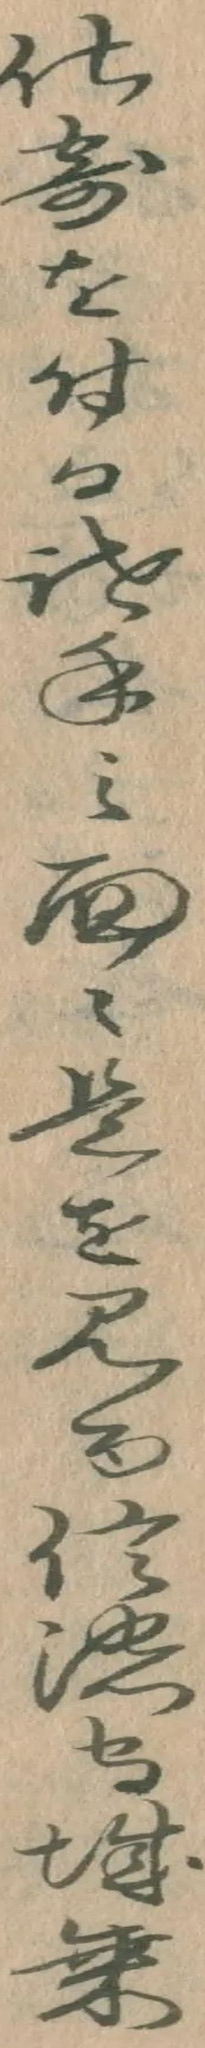仕寄を付る諸手之面々是を見而信濃守城乗
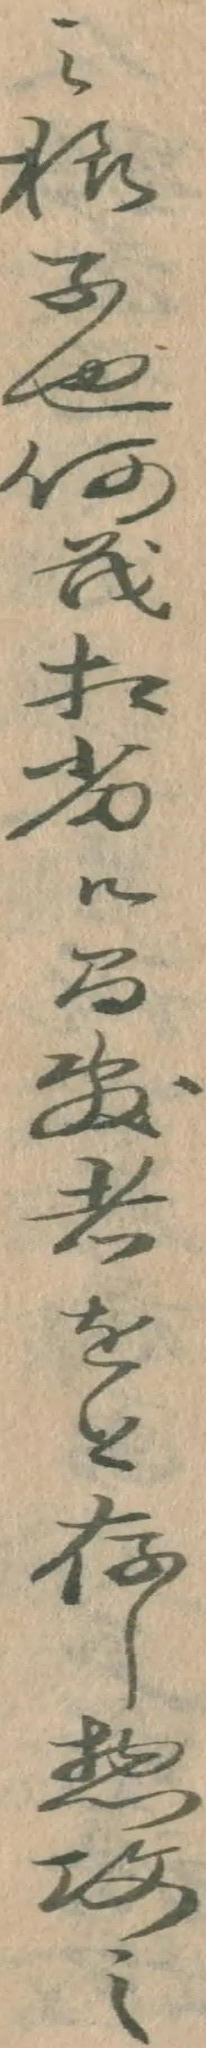之様子也何茂相劣候間敷者をと存し惣攻之
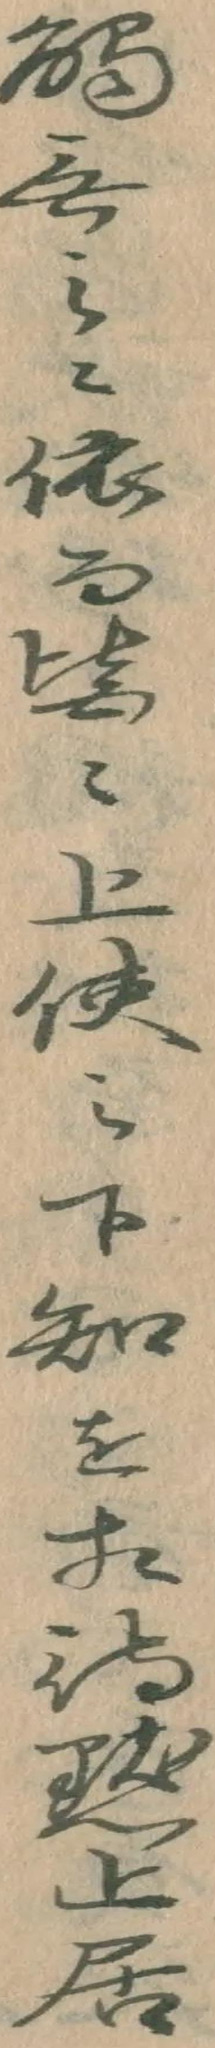触無之に依而皆々上使之下知を相待黙止居
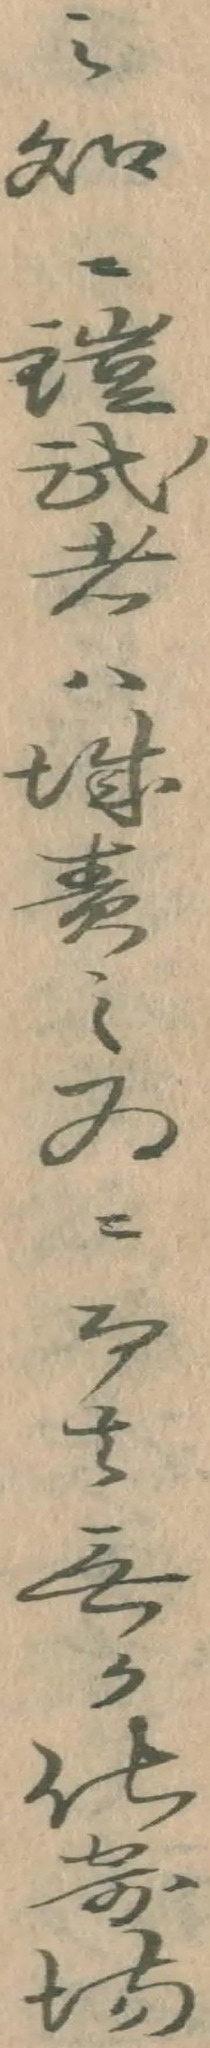之処に鎧武者は城責之ゐに而者無く仕寄場

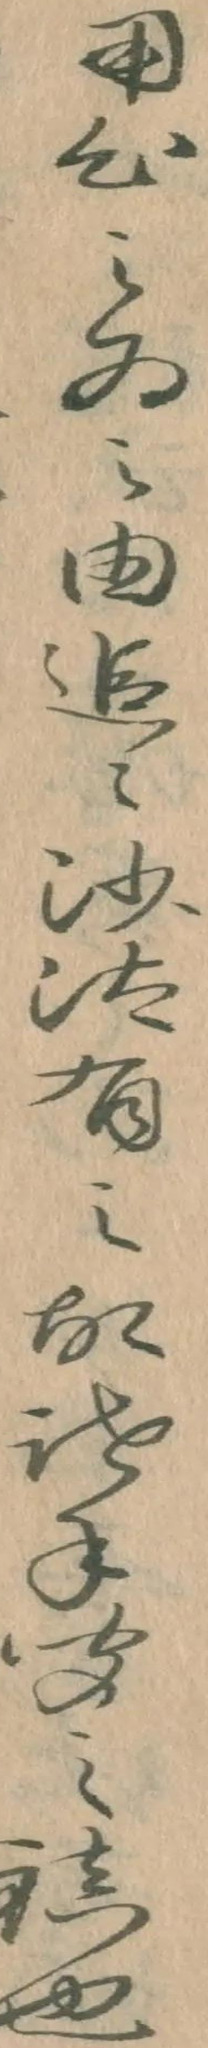用心之ゐ之由迄之沙汰有之故諸手聞之鎮也
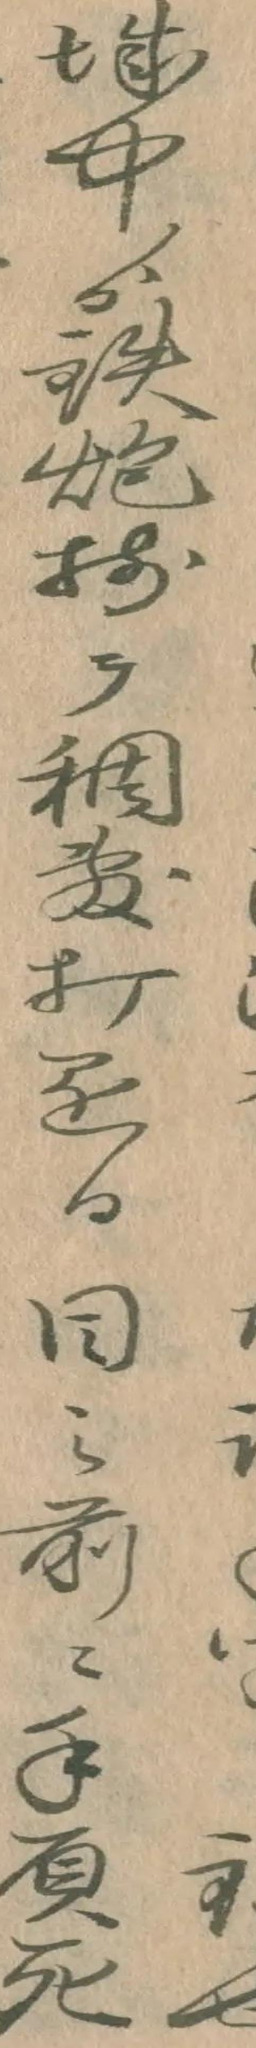城中ゟ鉄砲揃て稠敷打懸る目之前に手負死
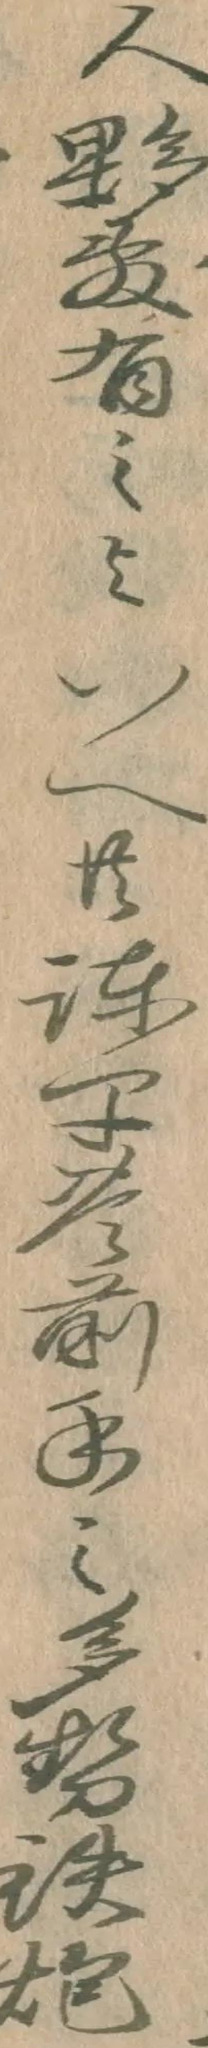人夥敷有之与いへ共諌早豊前手之多勢鉄砲
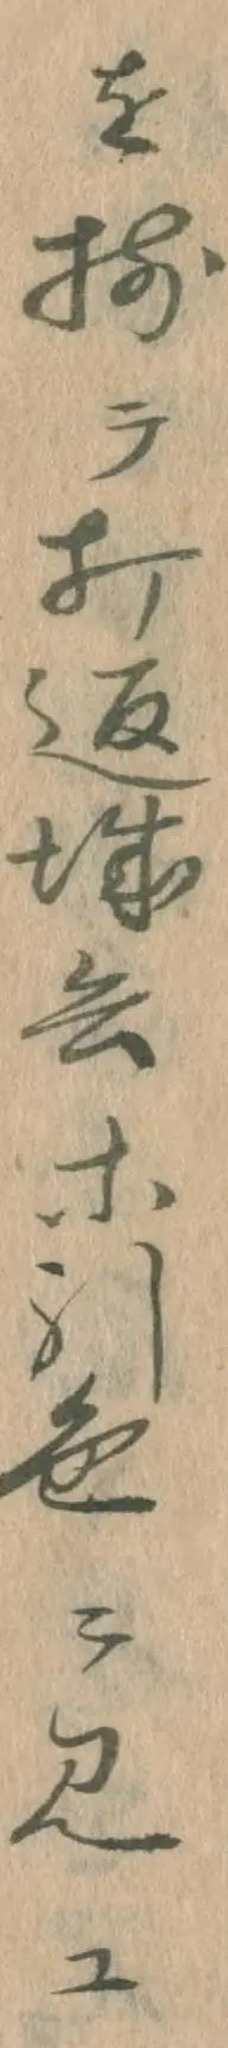を揃て打返城兵等引色て見ゆ
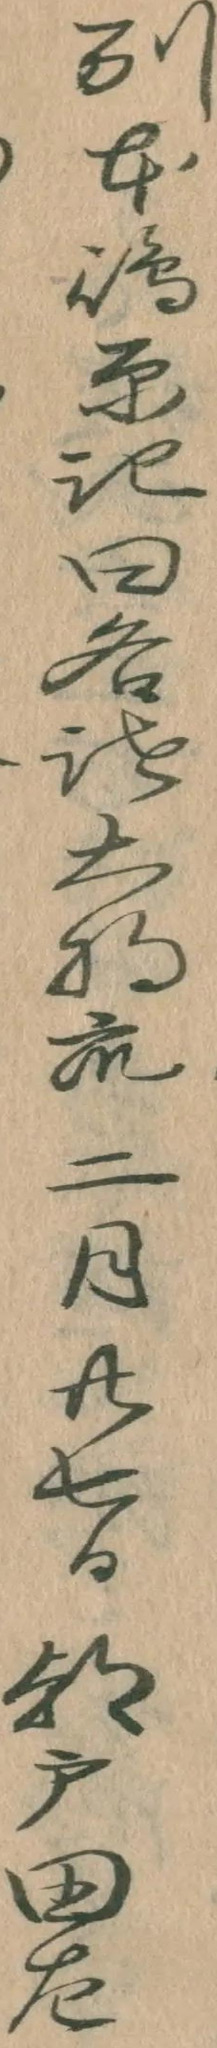別本島原記曰各諸大将衆二月廿七日朝戸田左
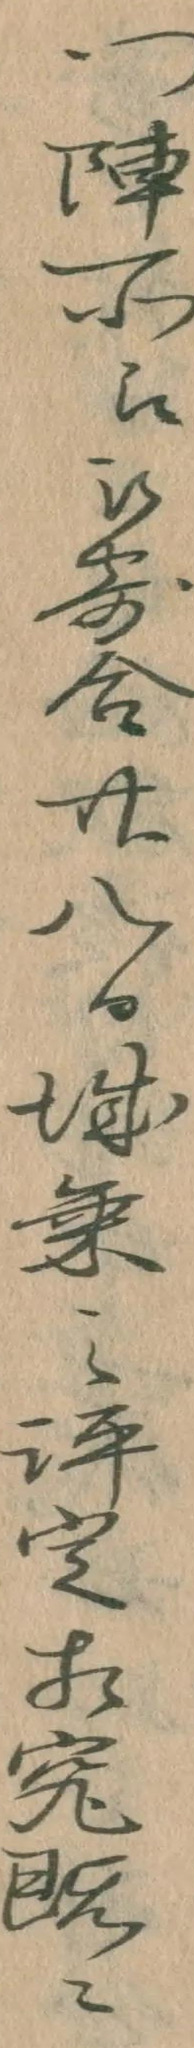門陣所江被寄合廿八日城乗之評定相究既に
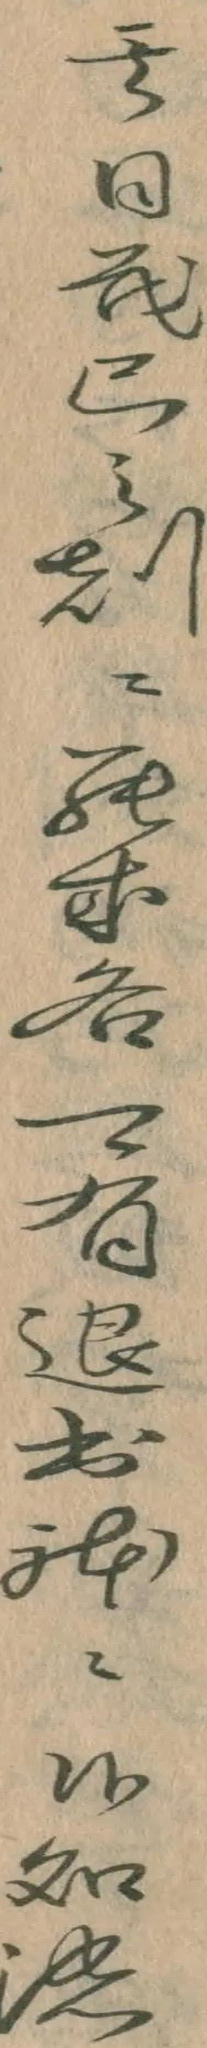其日茂巳之刻に罷成各可有退出躰に候処濃
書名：切支丹御退治記 49巻. [7]
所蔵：国立国会図書館 National Diet Library, JAPAN
